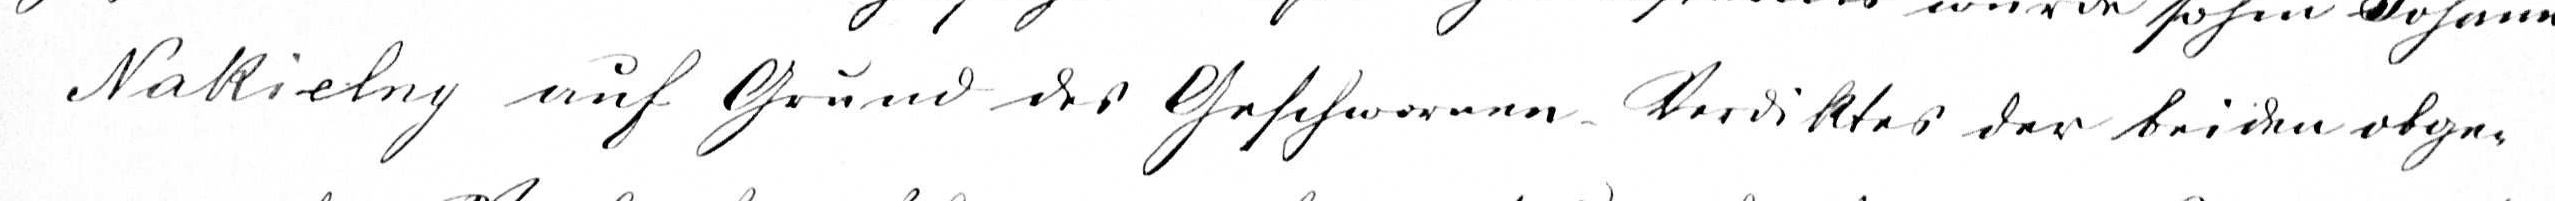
Nakielny auf Grund des Geschwornen. Verdiktes der bei den obge¬
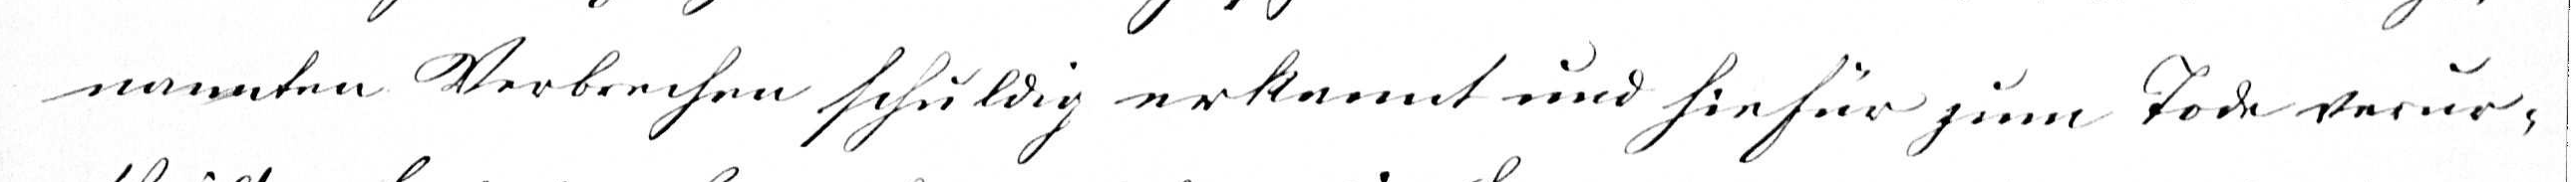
nannten Verbrechen schuldig erkannt und hiefür zum Tode verur¬
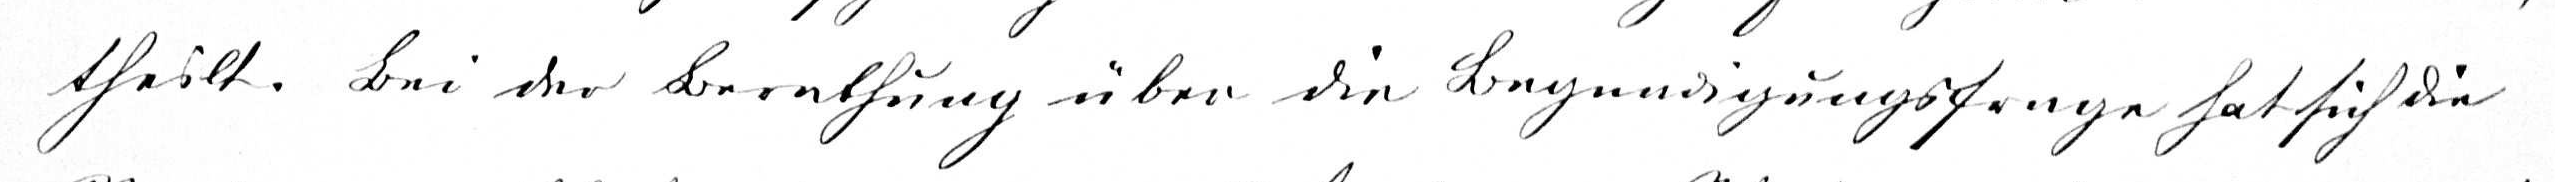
theilt. Bei der Berathung über die Begnadigungsfrage hat sich die
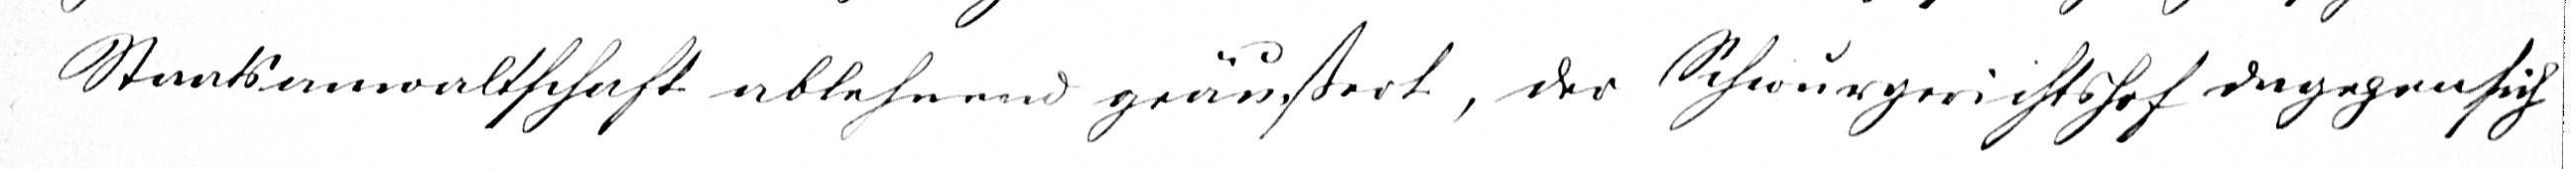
Staatsanwaltschaft ablehnend geäußert, der Schwurgerichtshof dagegen sich
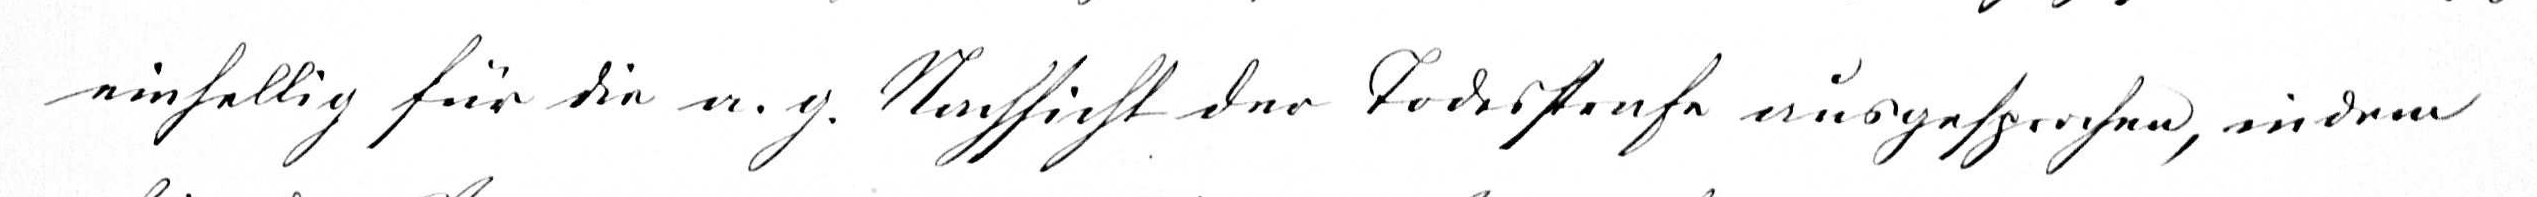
einhellig für die a. g. Nachsicht der Todesstrafe ausgesprochen, in dem
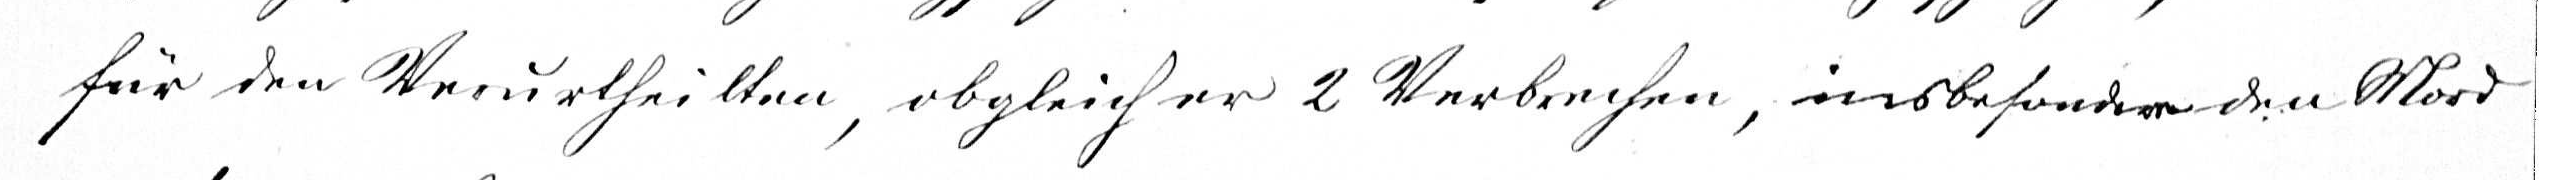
für den Verurtheilten, obgleich er 2 Verbrechen, insbesondere den Mord
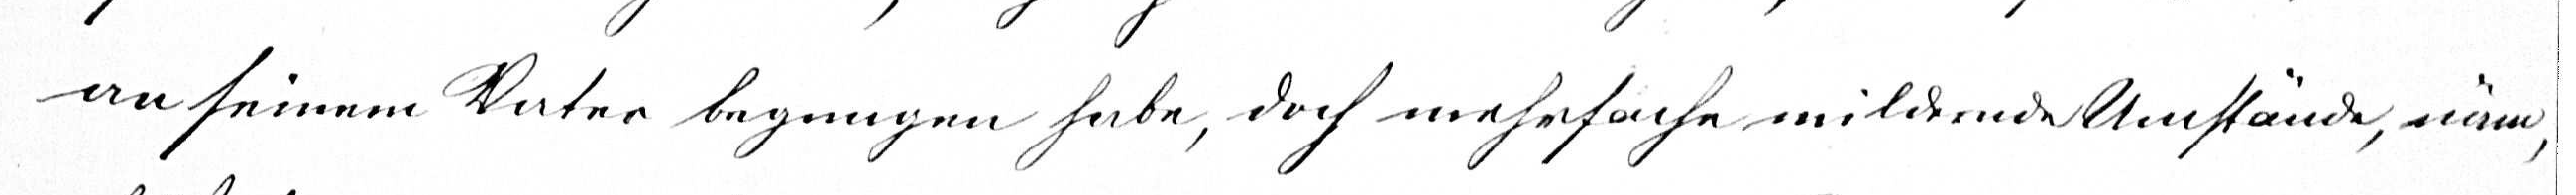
an seinem Vater begangen habe, doch mehrfache mildernde Umstände, näm¬
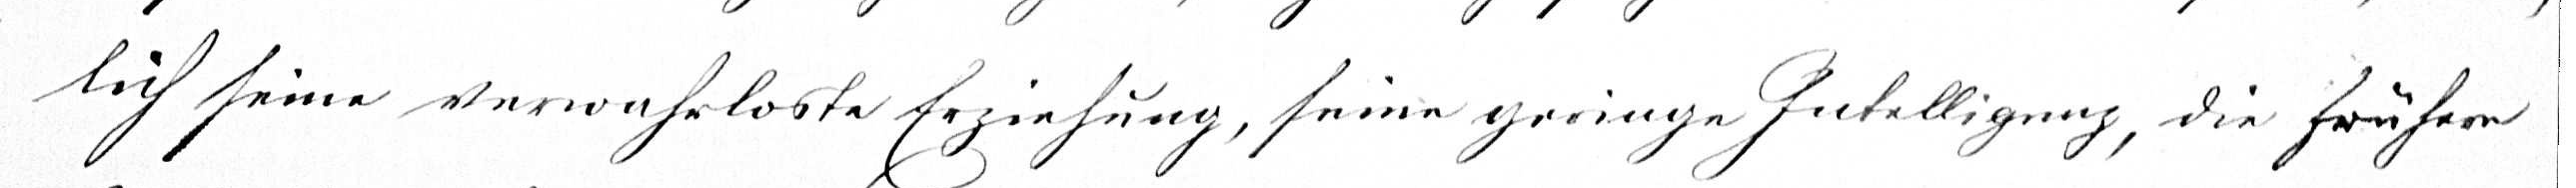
lich seine verwahrloste Erziehung, seine geringe Jntelligenz, die frühere
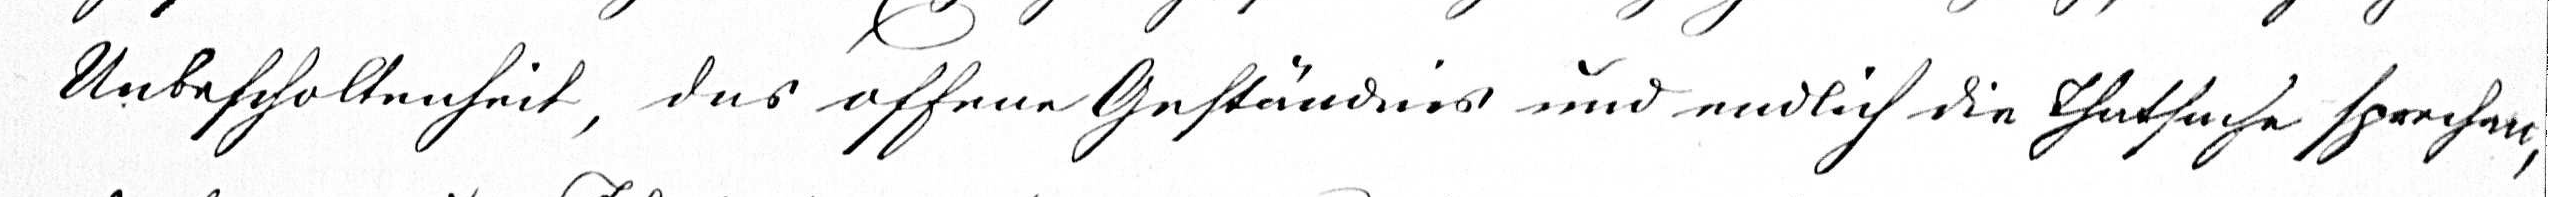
Unbescholtenheit, das offene Geständnis und endlich die Thatsache sprechen,
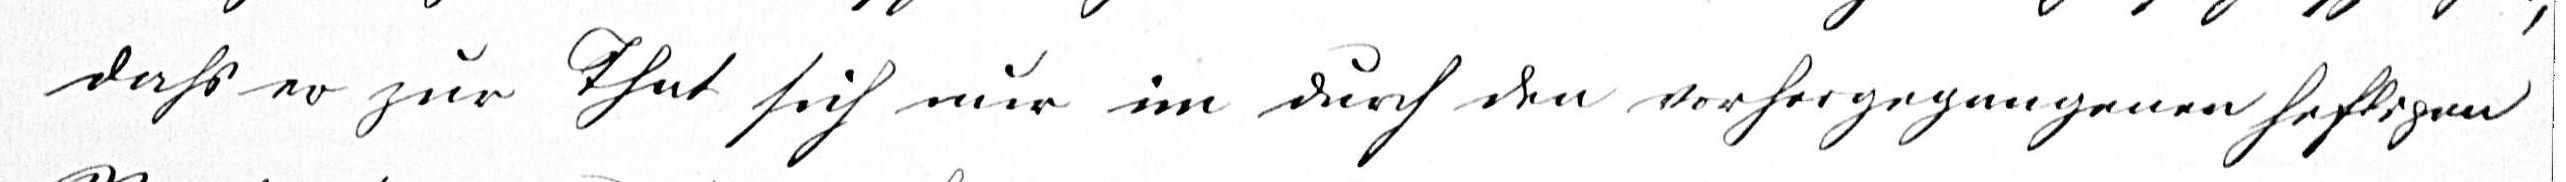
daß er zur That sich nur im durch den vorhergegengenen heftigen
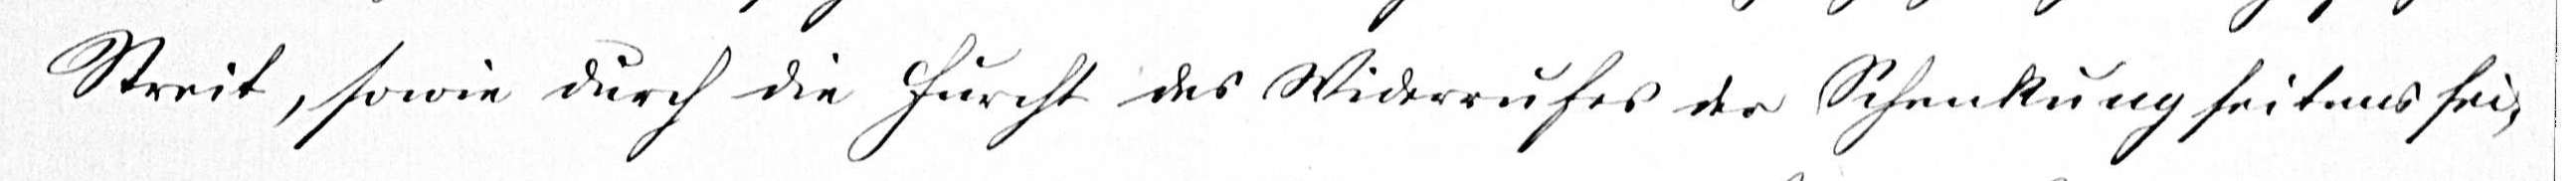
Streit, sowie durch die Furcht des Widerrufes der Schenkung seitens sei¬
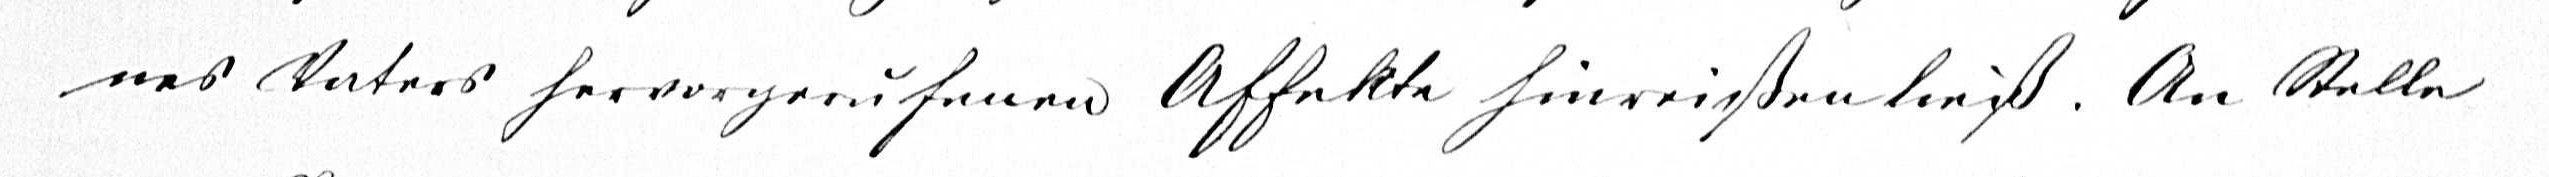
nes Vaters hervorgerufenen Affekte hinreißen ließ. An Stelle
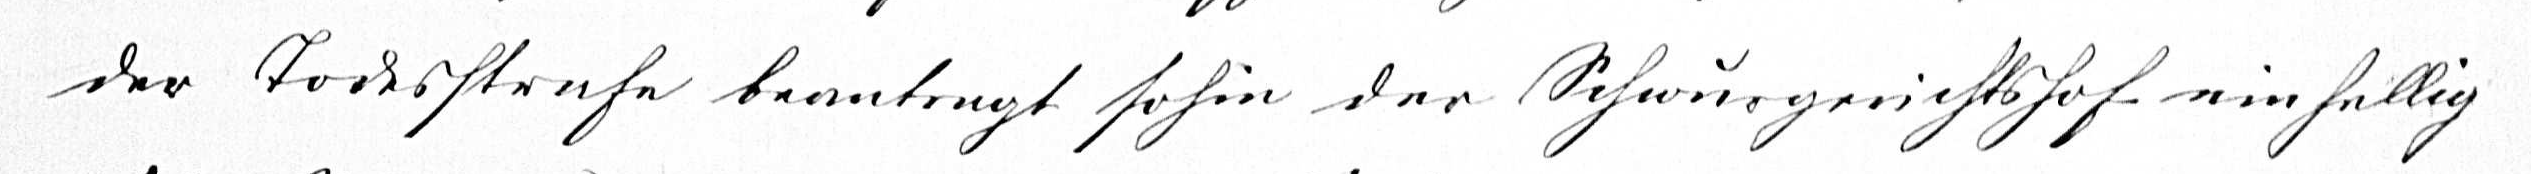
der Todesstrafe beantragt sohin der Schwurgerichtshof einhellig
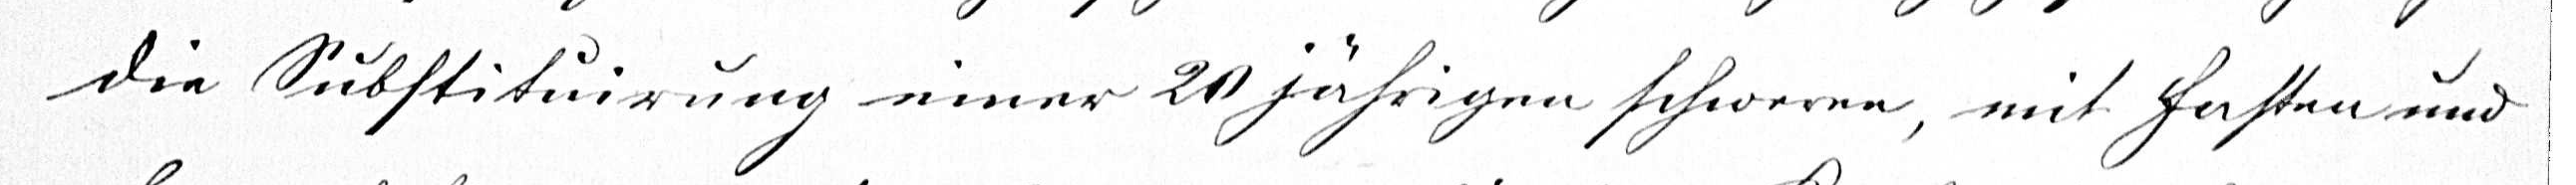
die Substituirung einer 20 jährigen schweren, mit Fasten und
